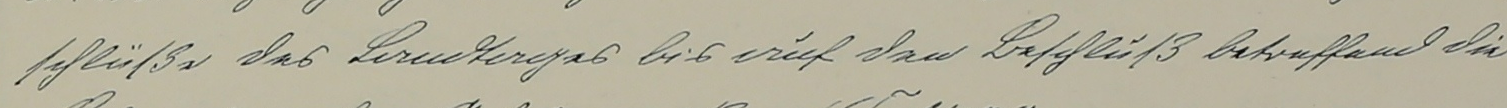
schlüße des Landtages bis auf den Beschluß betreffend die
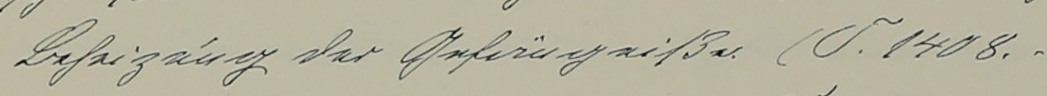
Beheizung der Gefängniße (T.1408.
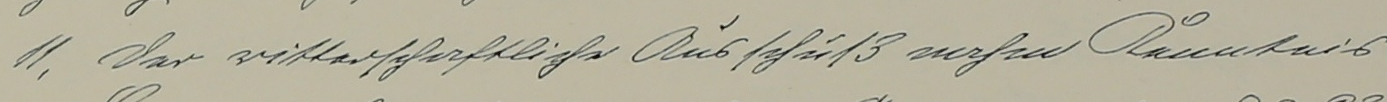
11. Der ritterschaftliche Ausschuß nahm Kenntnis
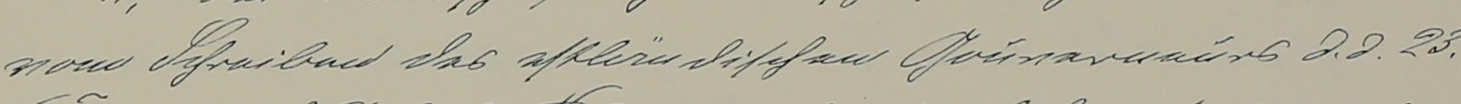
vom Schreiben des estländischen Gouverneurs d.d. 23.
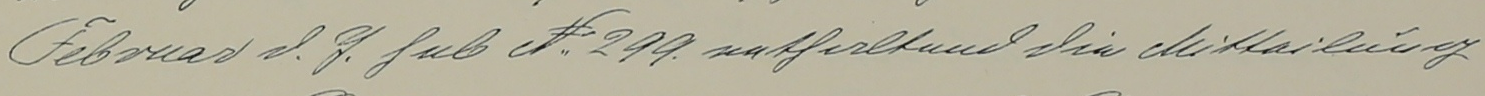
Februar d.J. sub No. 299, enthaltend die Mitteilung
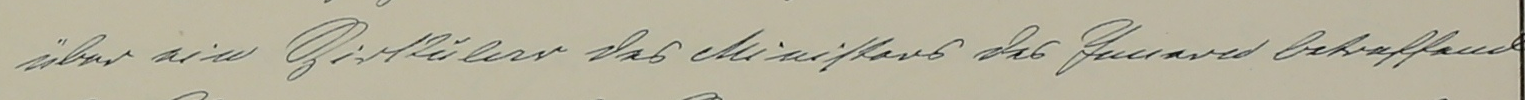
über ein Zirkular des Ministers des Innern betreffend
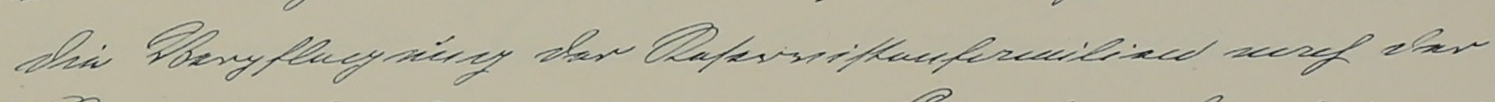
die Verpflegung der Reservistenfamilien nach der
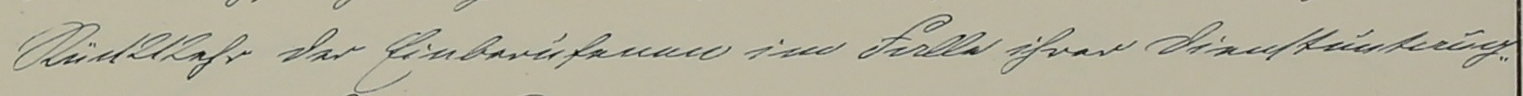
Rückkehr des Einberufenen im Falle der Dienstuntaug-
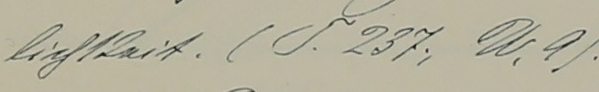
lichkeit. (T.237; U.9).
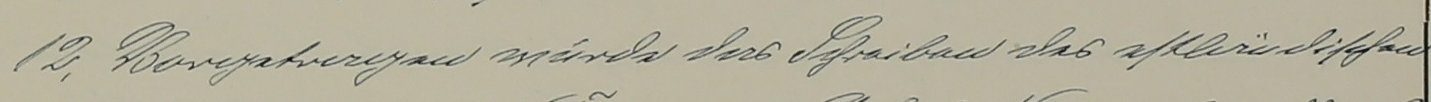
12. Vorgetragen wurde das Schreiben des estländischen
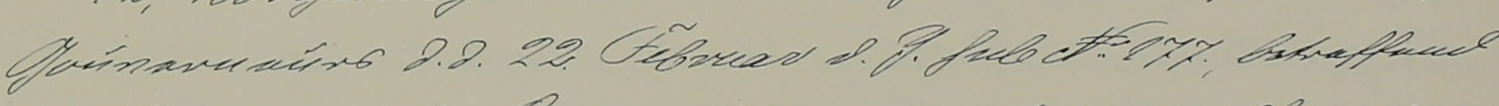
Gouverneurs d.d. 22. Februar d.J. sub No. 177, betreffend
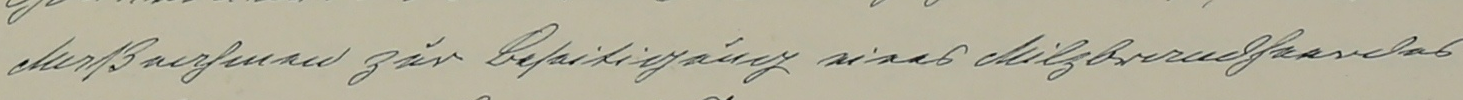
Maßnahmen zur Beseitigung eines Milzbrandherdes
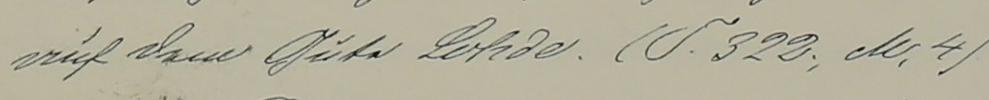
auf dem Gute Lohde. (T.322; M.4)
